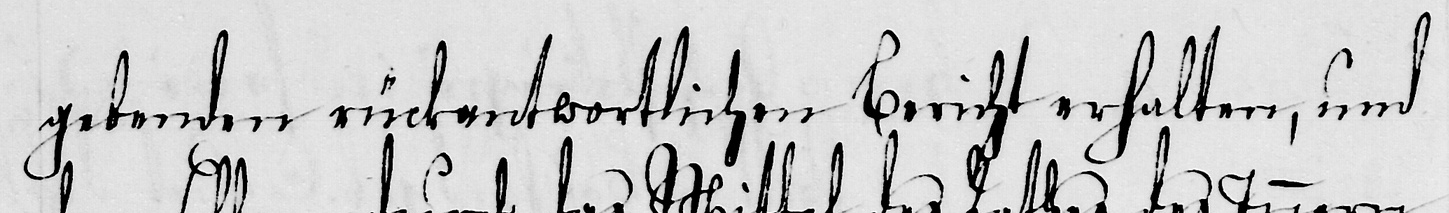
gebenden rückantwortlichen Bericht erhalten, und
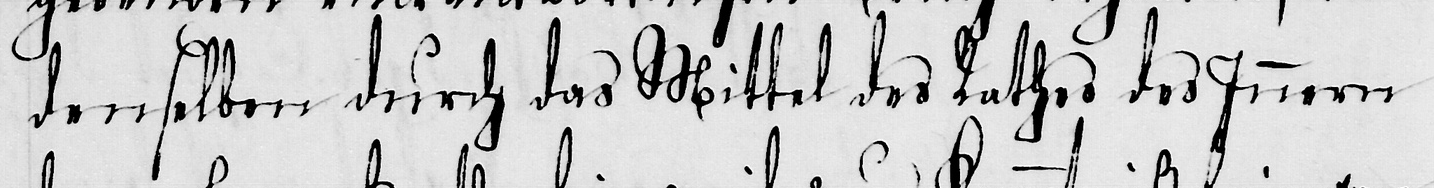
denselben durch das Mittel des Rathes des Innern
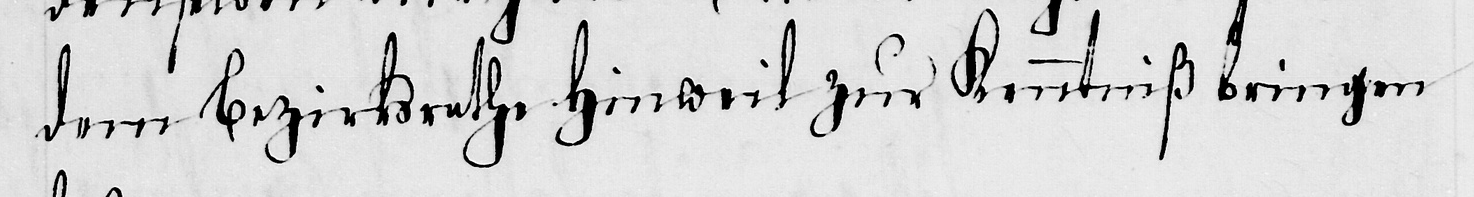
dem Bezirksrathe Hinweil zur Kenntniß bringen
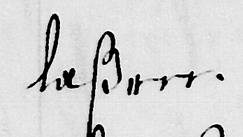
laßen.
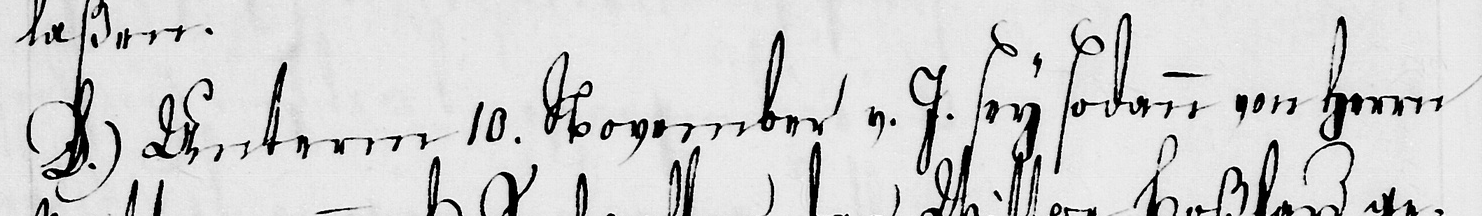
D.) Unterm 10. November v. J. sey sodann von Herrn
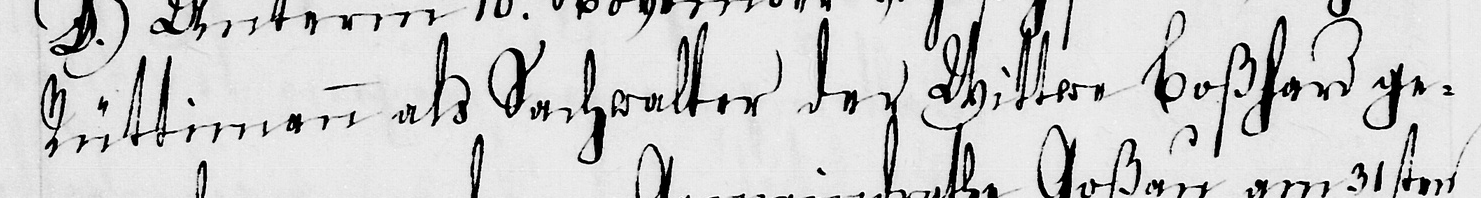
Rüttimann als Sachwalter der Wittwe Boßhard ge¬
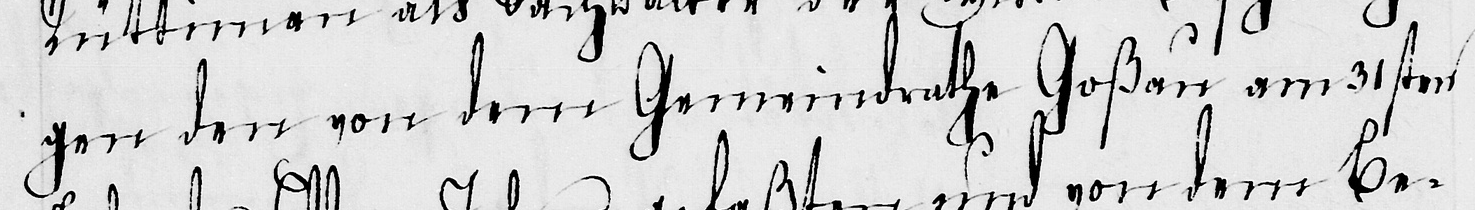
gen den von dem Gemeindrathe Goßau am 31sten
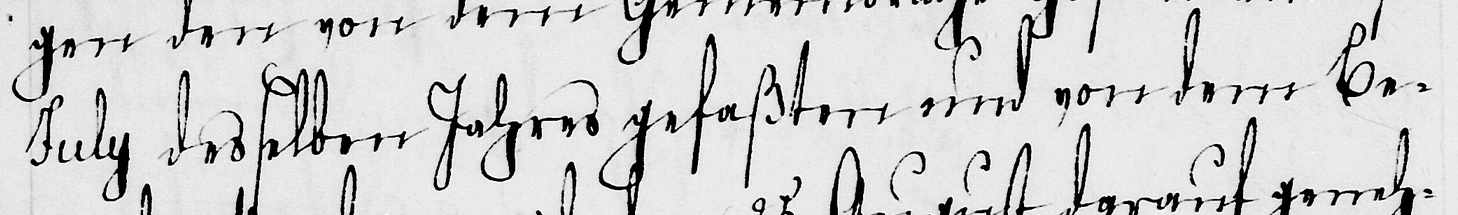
July desselben Jahres gefaßten und von dem Be¬
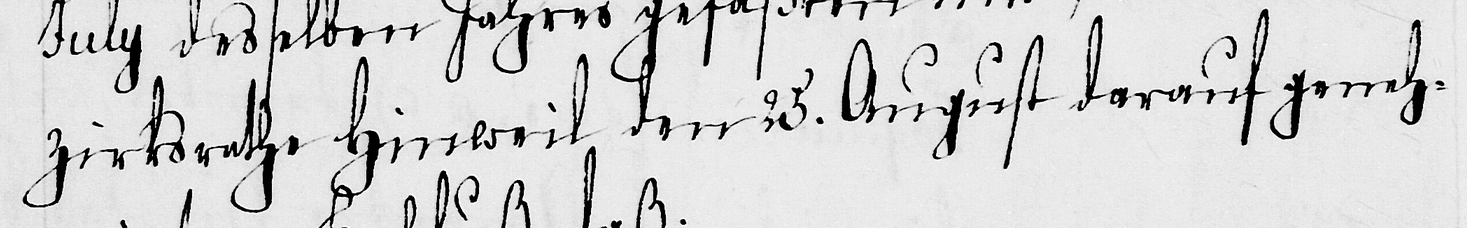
zirksrathe Hinweil den 25. August darauf geneh¬
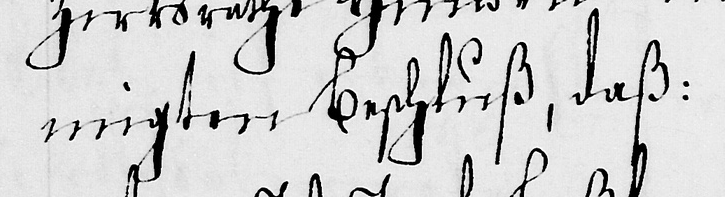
migten Beschluß, daß:
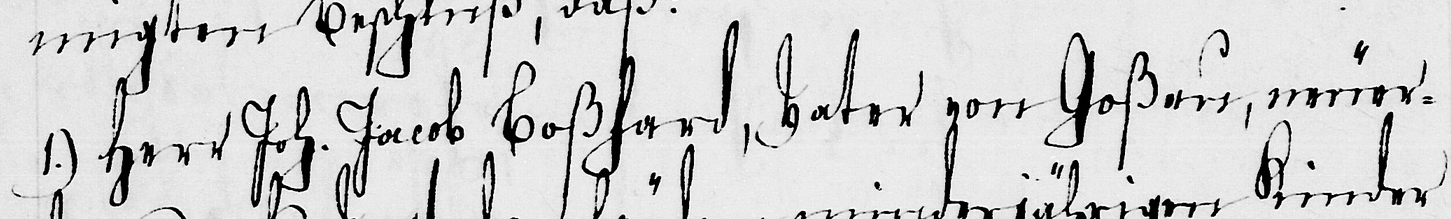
1.) Herr Joh. Jacob Boßhard, Vater von Goßau, neuer¬
